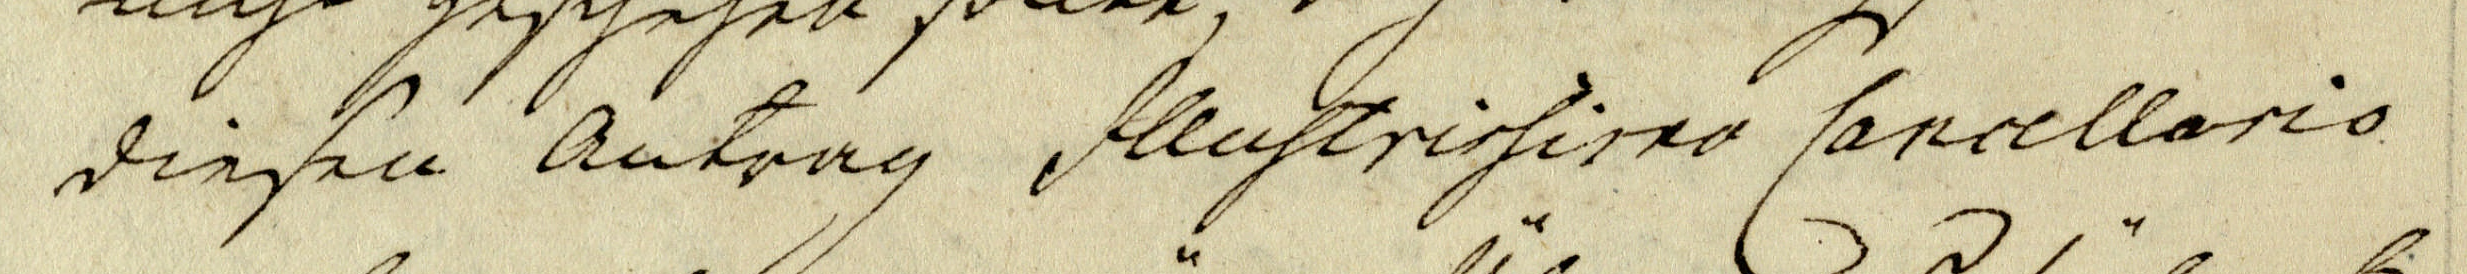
diesen Antrag Illustrissimo Cancellario
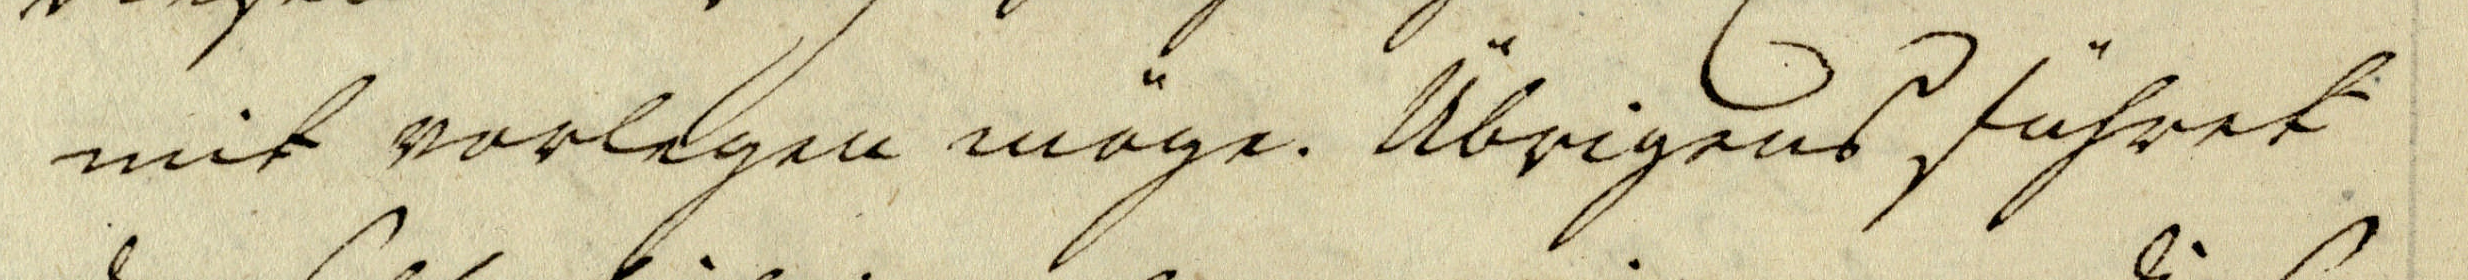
mit vorlegen möge. Übrigens führet
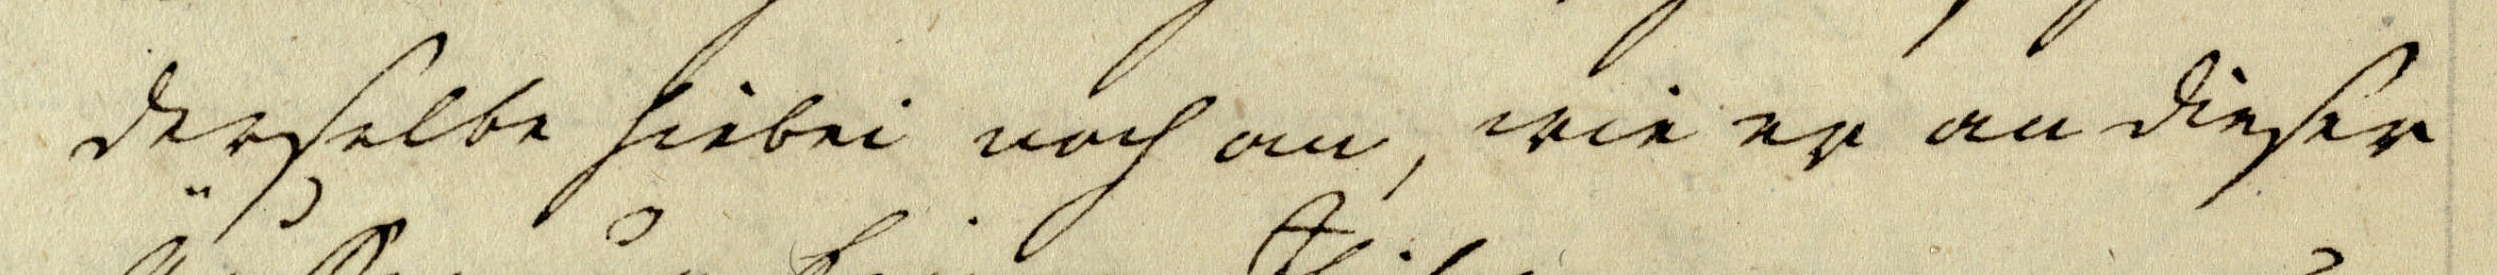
derselbe hiebei noch an, wie er an dieser
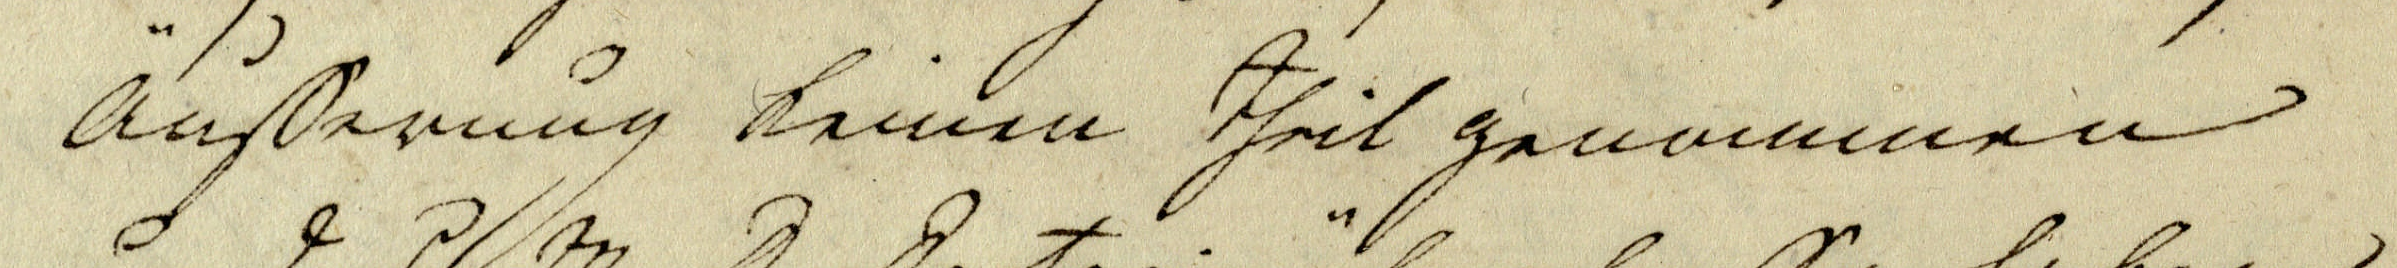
Äusserung keinen Theil genommen
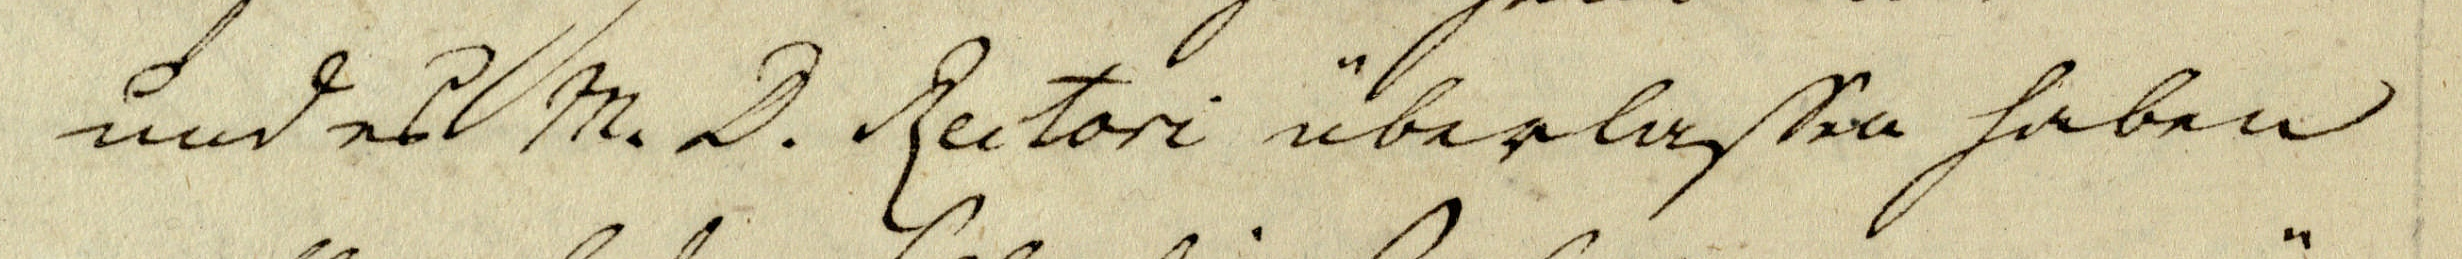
und es M. D. Rectori überlassen haben
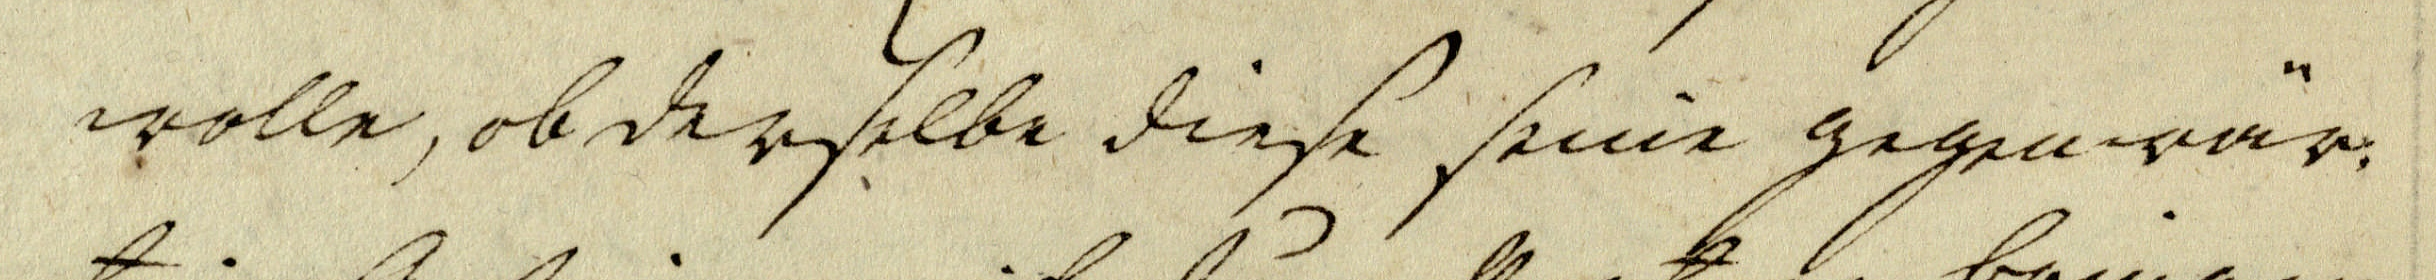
wolle, ob derselbe diese seine gegenwär¬
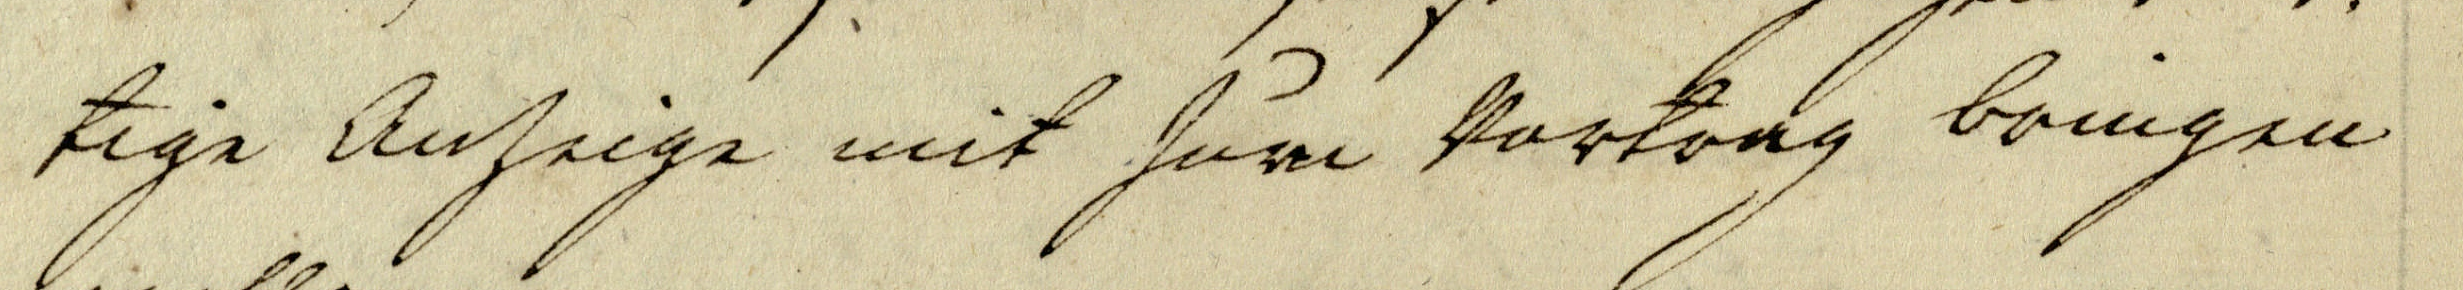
tige Anzeige mit zum Vortrag bringen
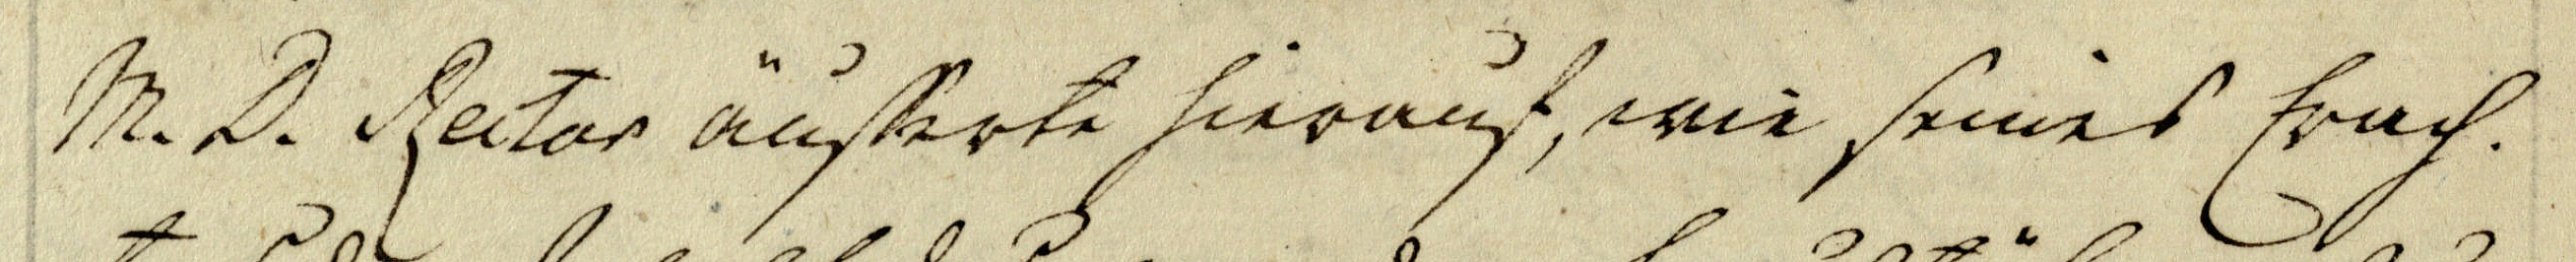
M. D. Rector äusserte hierauf, wie seines Erach¬
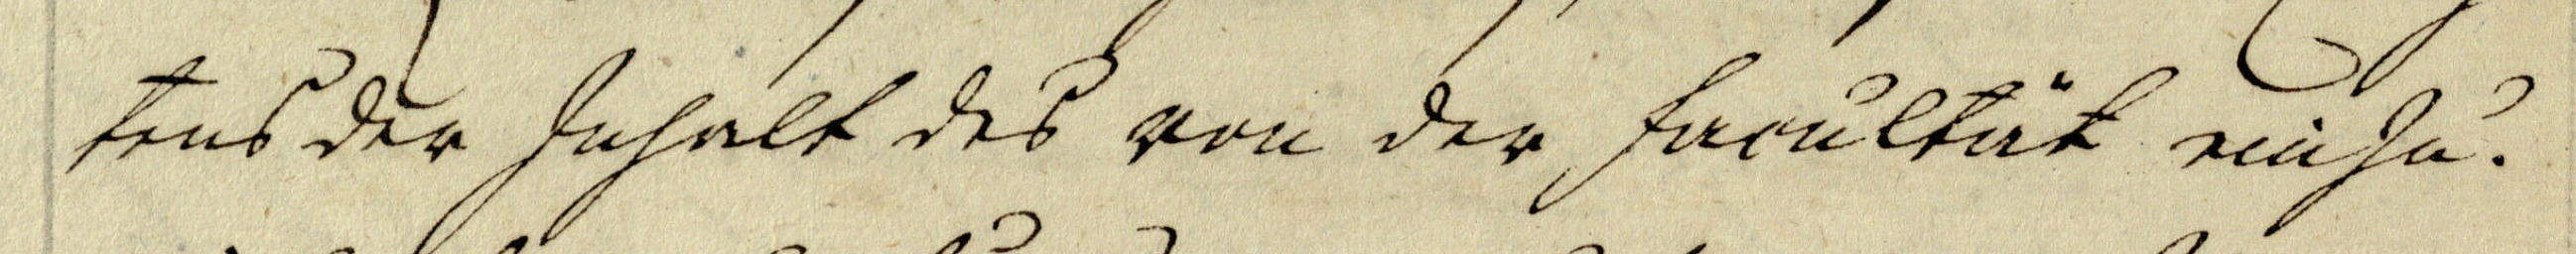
tens der Inhalt des von der Facultät einzu¬
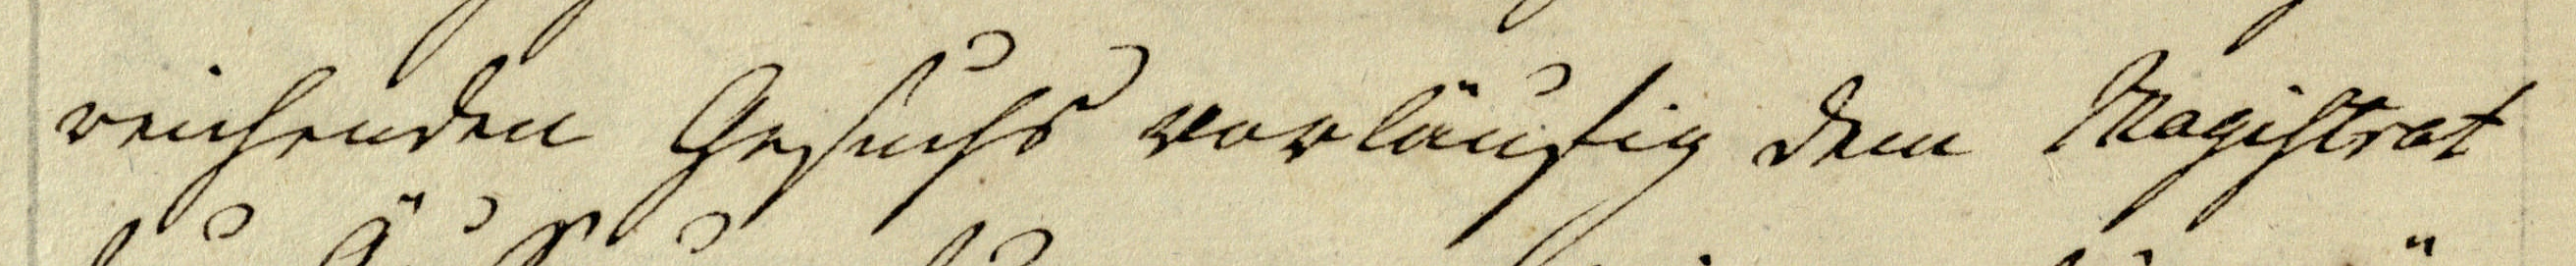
reichenden Gesuchs vorläufig dem Magistrat
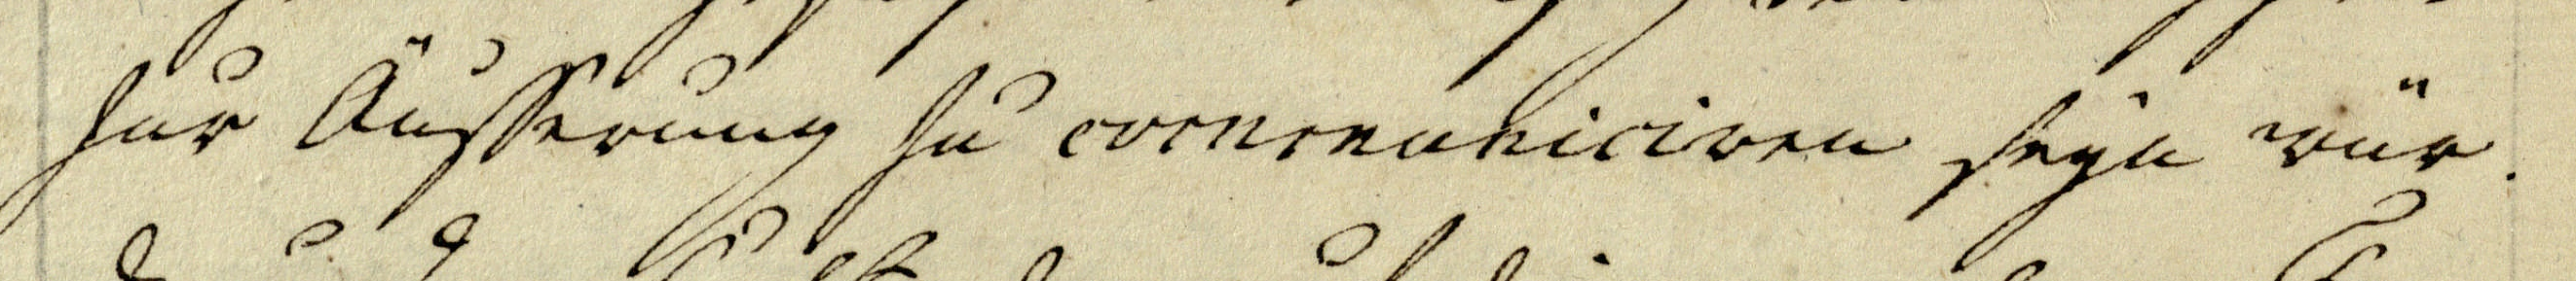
zur Äusserung zu communiciren seÿn wür¬
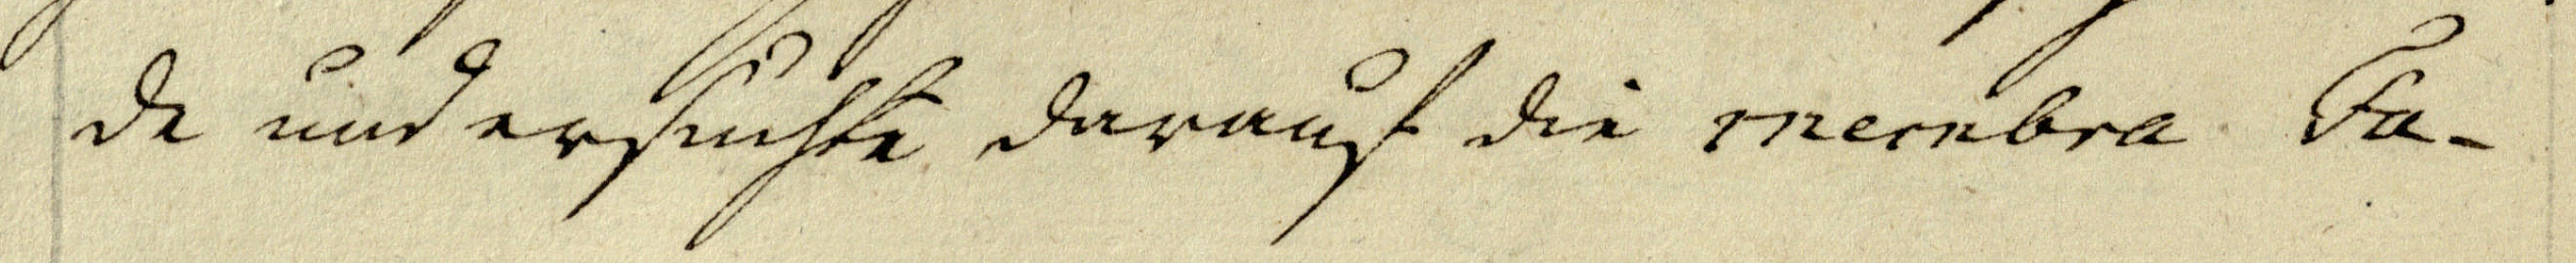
de und ersuchte darauf die membra Fa¬
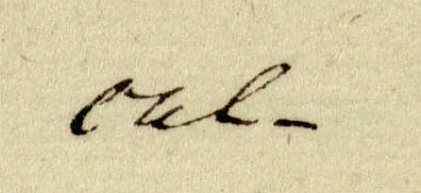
cul
